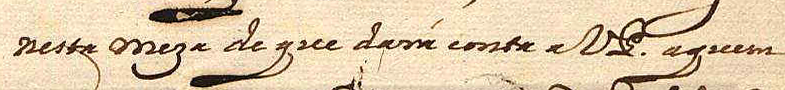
nesta meza de que dará conta a V P. a quem
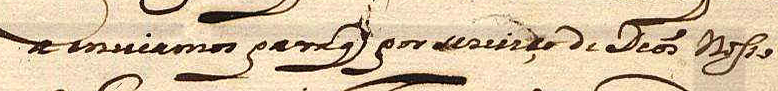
a enuiamos para q̄ por seruiço de Deos̄ nosso
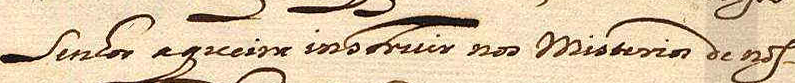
Senhor a queira instruir nos Misterios de nos
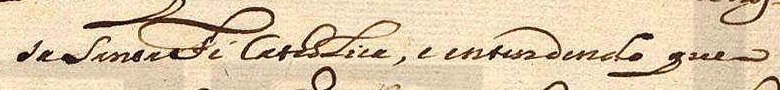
sa Santa Fé Catholica, e entendendo que
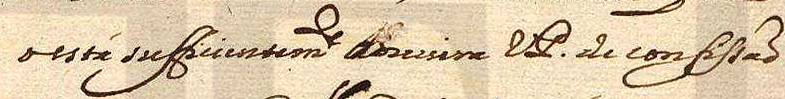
o está sufficientemte houuira V P. de confissaõ
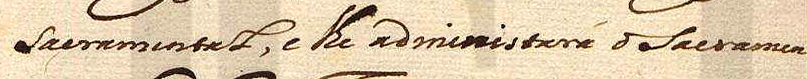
sacramental, e lhe administara o Sacramen
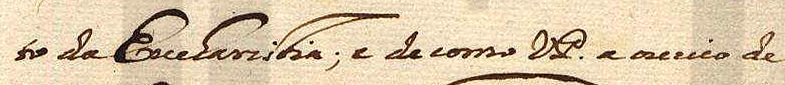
to da Eucharistia; e de como V P. a ouuio de
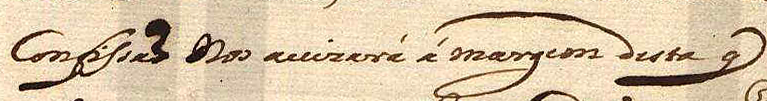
Confissaõ nos auizará á margem desta q̄
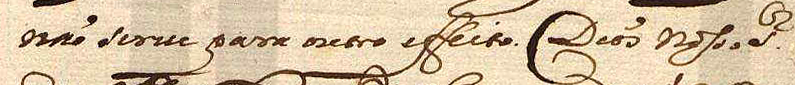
naõ serue para outro effeito. Deos̄ nosso s.or
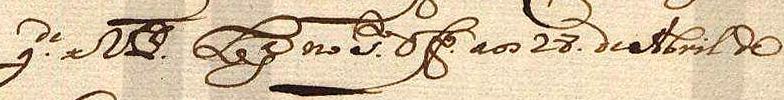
g.de a V P. Lxa no s.to off.o aos 28. de Abril de
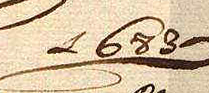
1683
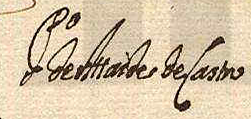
Po de Attaide de Castro
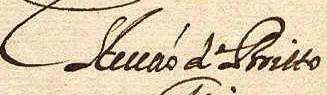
Esteuaõ de Britto
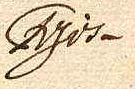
Fojos
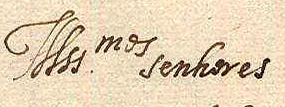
Illss.mos senhores
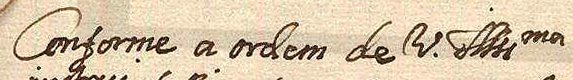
Conforme a ordem de V. Illssma
